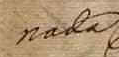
nada
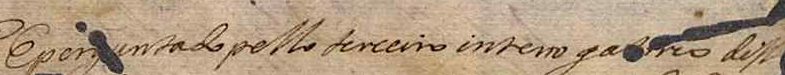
E perguntado pello terceiro interrogatorio disse
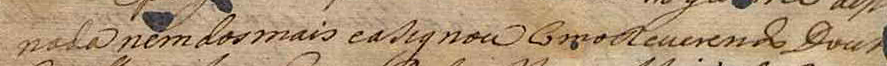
nada nem dos mais e asignou com o Reuerendo Dout
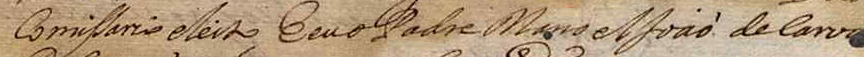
Comissario eleito E eu o Padre Manoel Joaõ de Carv
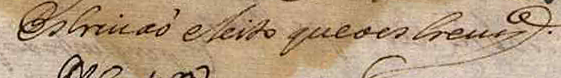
EsCriuaõ eleito que o esCreui.
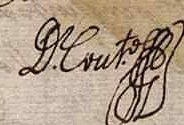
D.r Cout.o
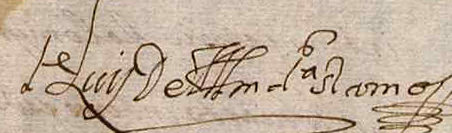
Ie Luis de Almda Ramos
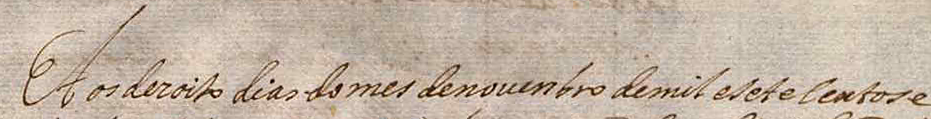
Aos dezoito dias do mes de nouembro de mil e setecentos e
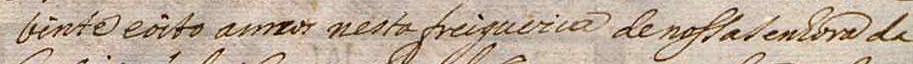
vinte e oito annos nesta freiguezia de nossa senhora da
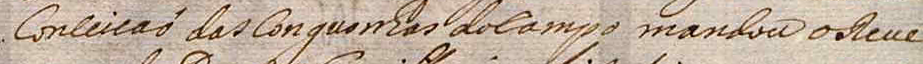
Conceiçaõ das Conguonhas do Campo mandou o Reue
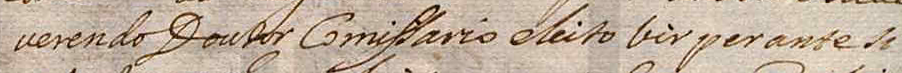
uerendo Doutor Comissario eleito vir perante si
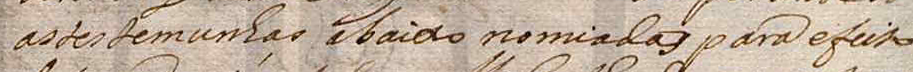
as testemunhas abaixo nomiadas para efeito
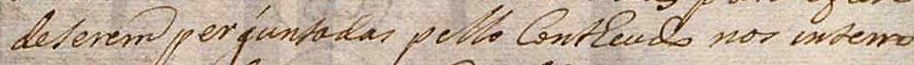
de serem perguntadas pello Contheudo nos interro
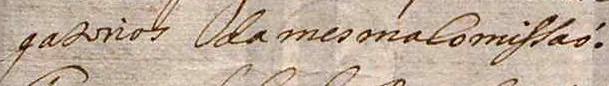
gatorios da mesma Comissaõ.
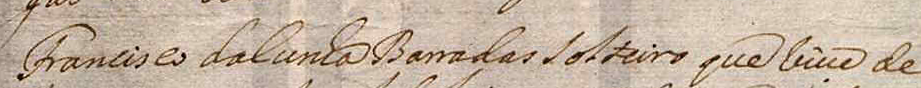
Francisco da Cunha Barradas solteiro que Viue de
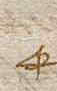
4
